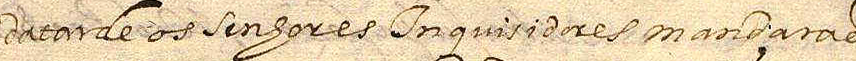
da tarde os senhores Inquisidores mandaraõ
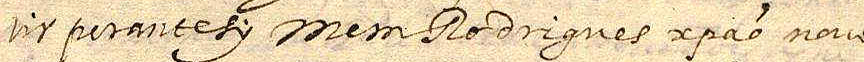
vir perante sy mem Rodrigues xpaõ nouo
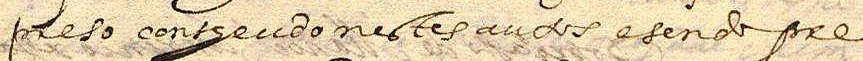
preso contheudo nestes autos e sendo pre
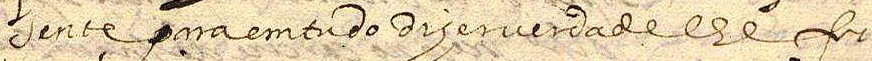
sente para em tudo dizer uerdade lhe foi
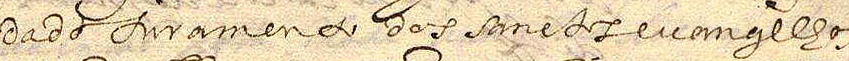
dado Iuramento dos sanctos euangelhos
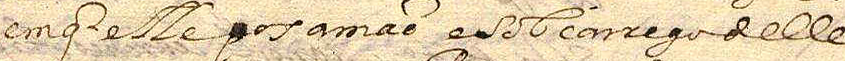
em q̄ elle pos a maõ e sob carrego delle
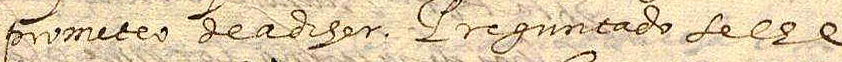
prometeo de a dizer. Preguntado se lhe
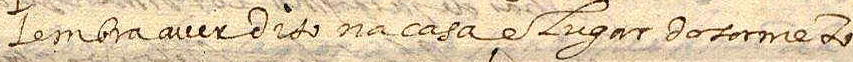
lembra auer dito na casa e Lugar do tormēto
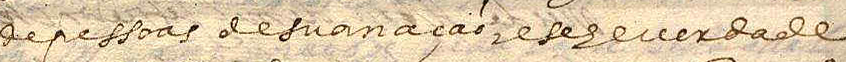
de pessoas de sua nação e se he uerdade
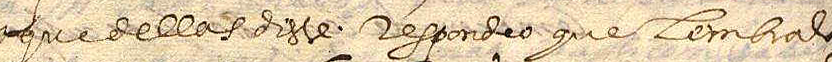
o que dellas disse. Respondeo que lembrado
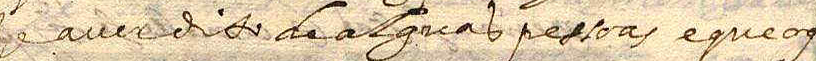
he auer dito de alguas̄ pessoas e que o q̄
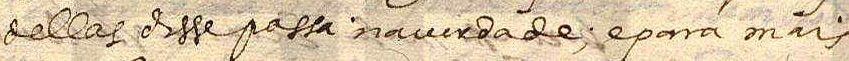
dellas disse passa na uerdade; e para mais
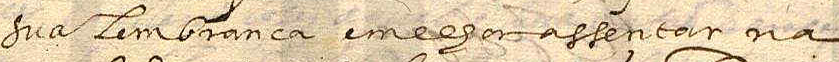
sua Lembrança e melhor assentar na
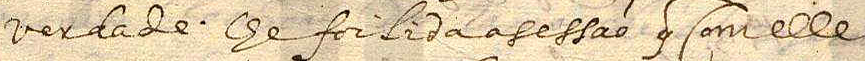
verdade lhe foi lida a sessaõ q̄ Com elle
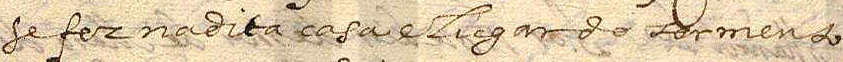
se fez na dita casa e Lugar de tormento
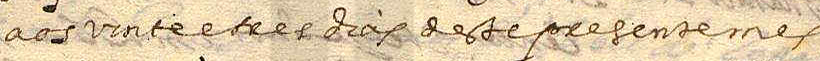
aos vinte e tres dias deste presente mes
